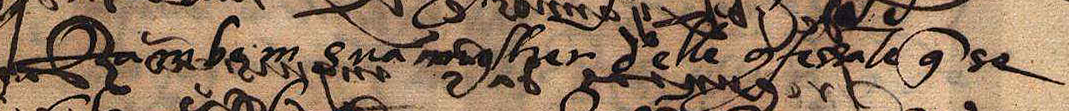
tambem sua molher delle ꝯfessāte q̄ se
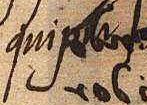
quipur
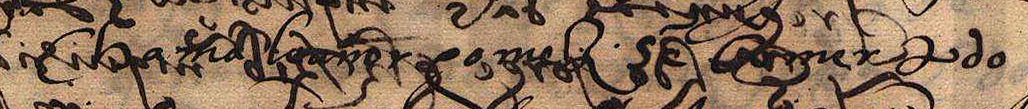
Chama lianor gomez sē comer todo
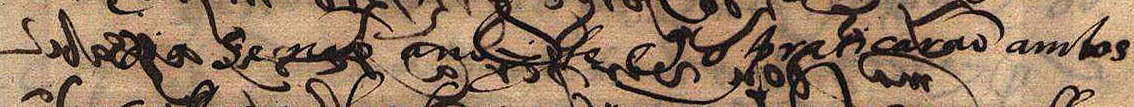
dia senão a noyte e o praticaraõ ambos
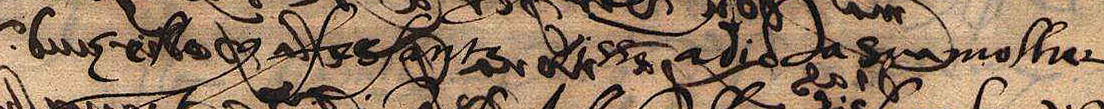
E elle q̄ ꝯfessante disse a dicta sua molher
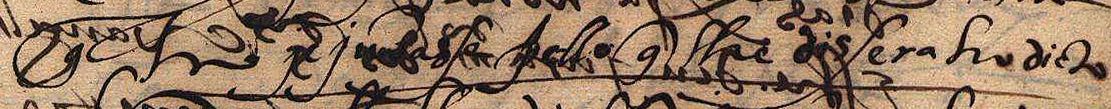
q̄ ho jejuōasse pello q̄ lhe dissera ho dicto
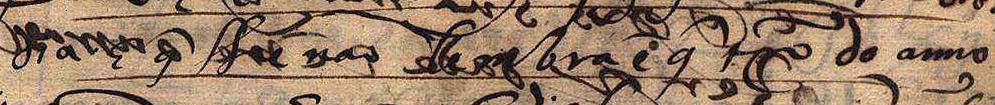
dia E q̄ lhe não llembra ē q̄ tpō do anno
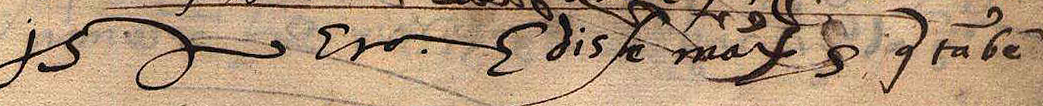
jsto Era E disse mays q̄ tābē
